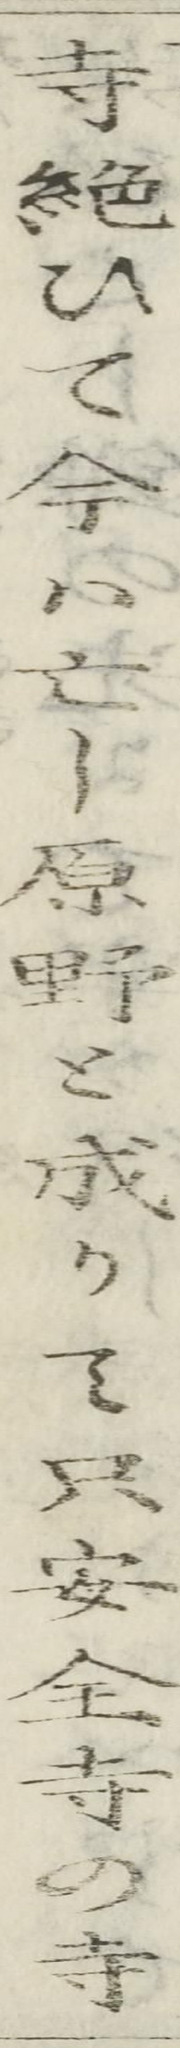寺絶ひて今は亡し原野と成りて只安全寺の寺
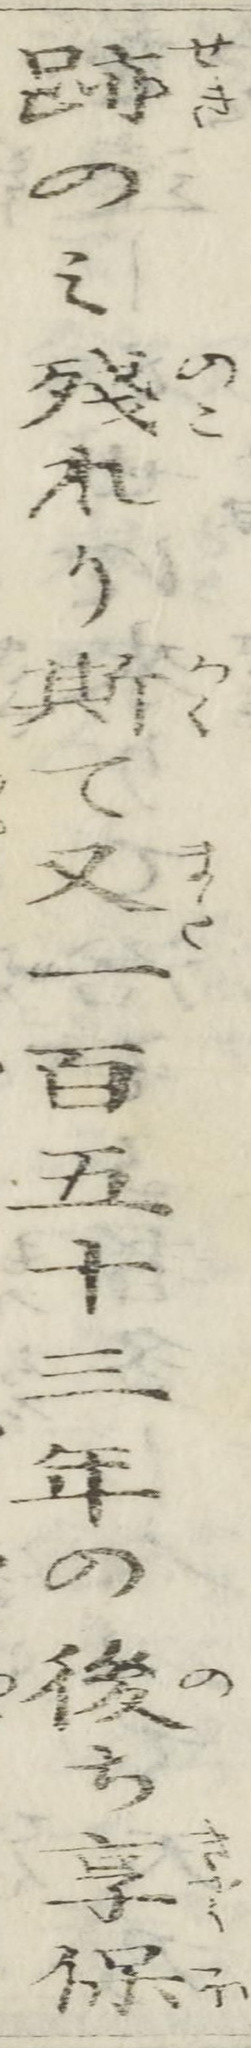跡のみ残れり斯て又一百五十三年の後ち享保
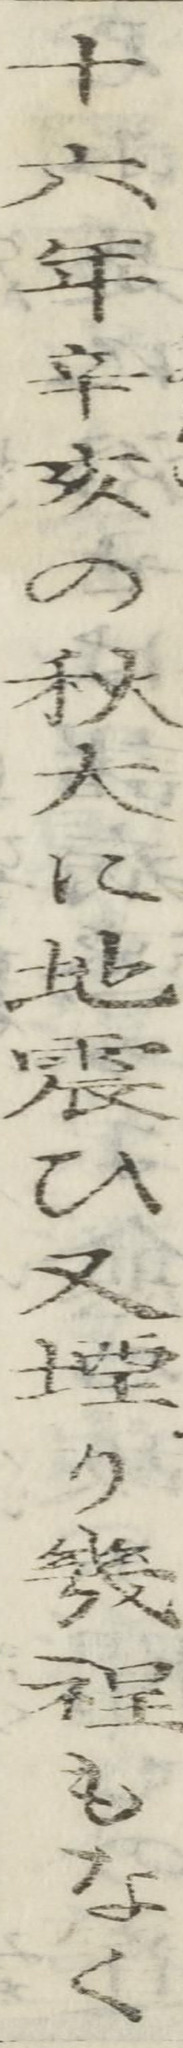十六年辛亥の秋大に地震ひ又堙り幾程もなく
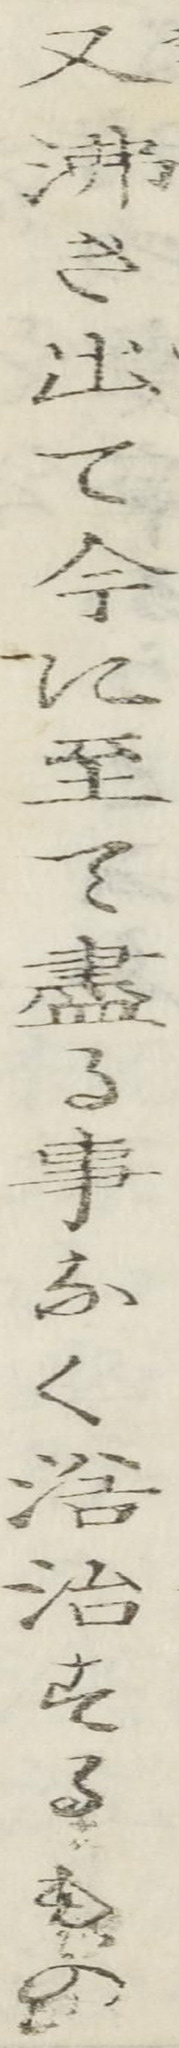又沸き出て今に至て尽る事なく浴治するもの
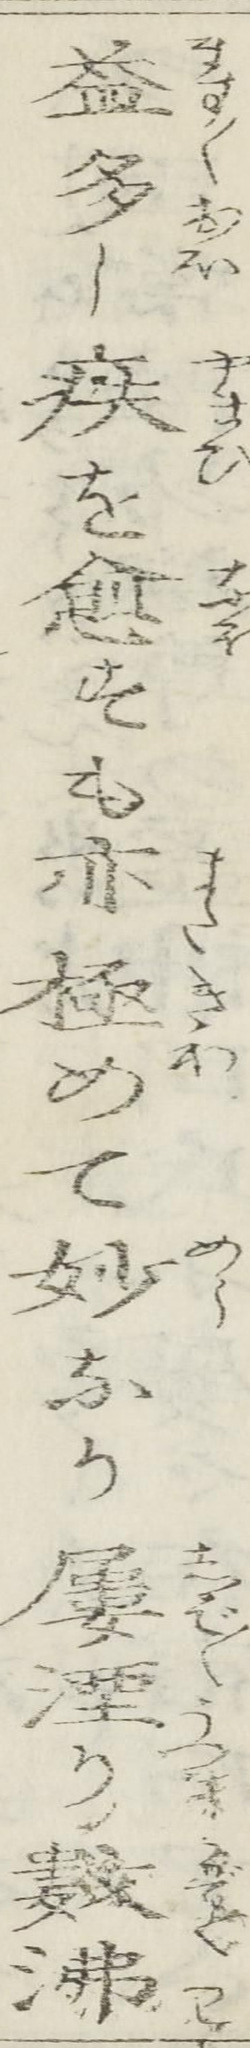益多し疾を愈すも亦極めて妙なり屡堙り数沸
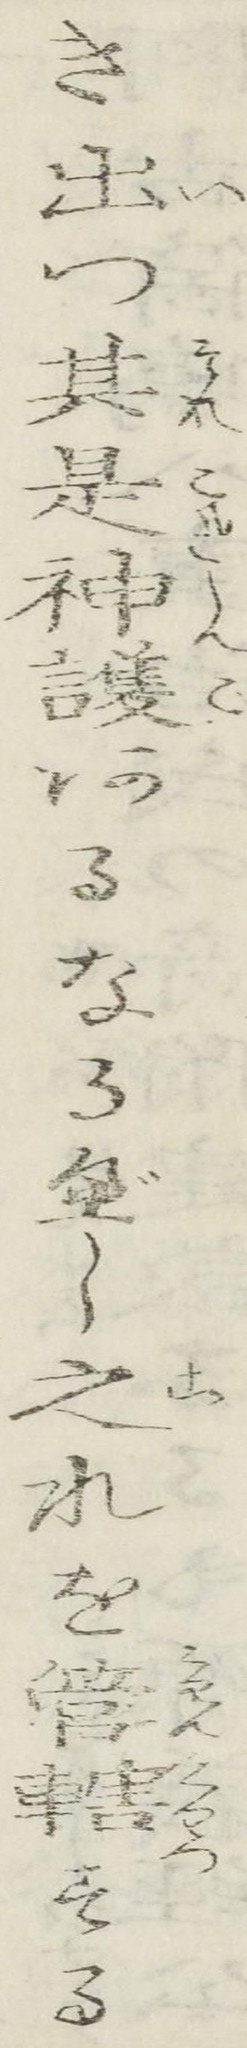き出つ其是神護あるなるべし之れを管轄する
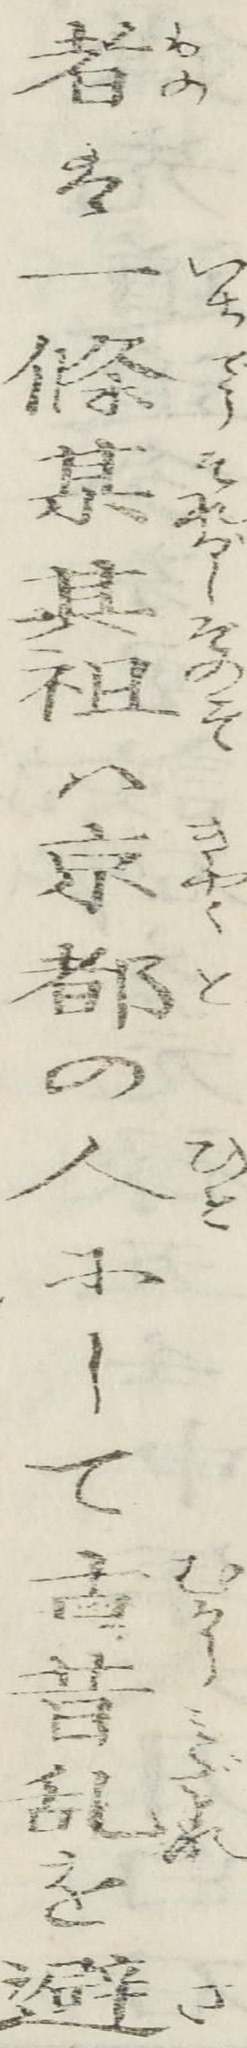者は一条某其祖は京都の人にして古昔乱を避
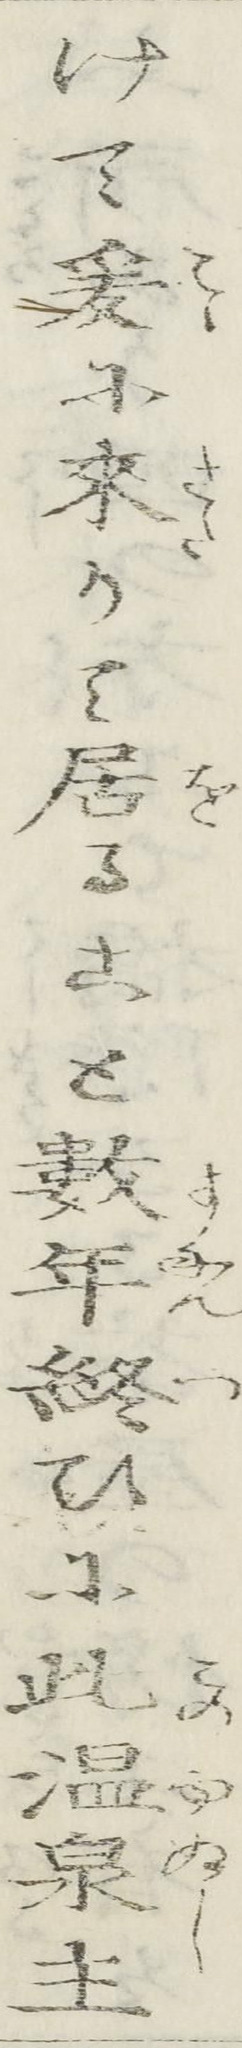けて爰に来りて居ること数年終ひに此温泉主
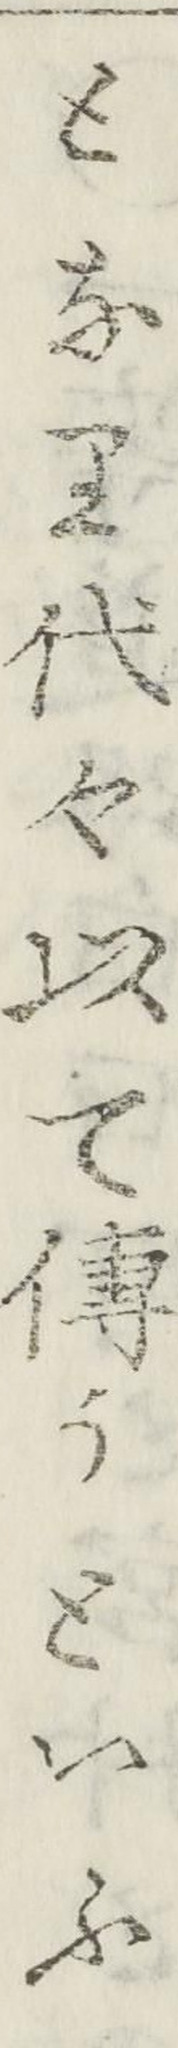となる代々以て伝うといふ
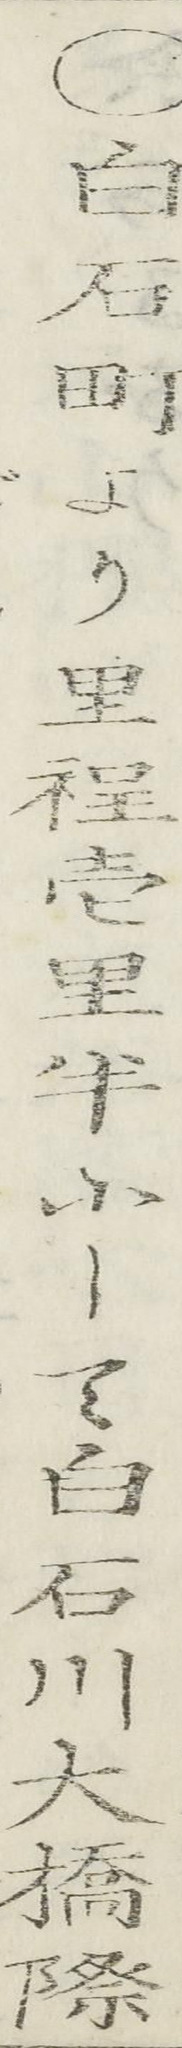〇白石町より里程壱里半にして白石川大橋際
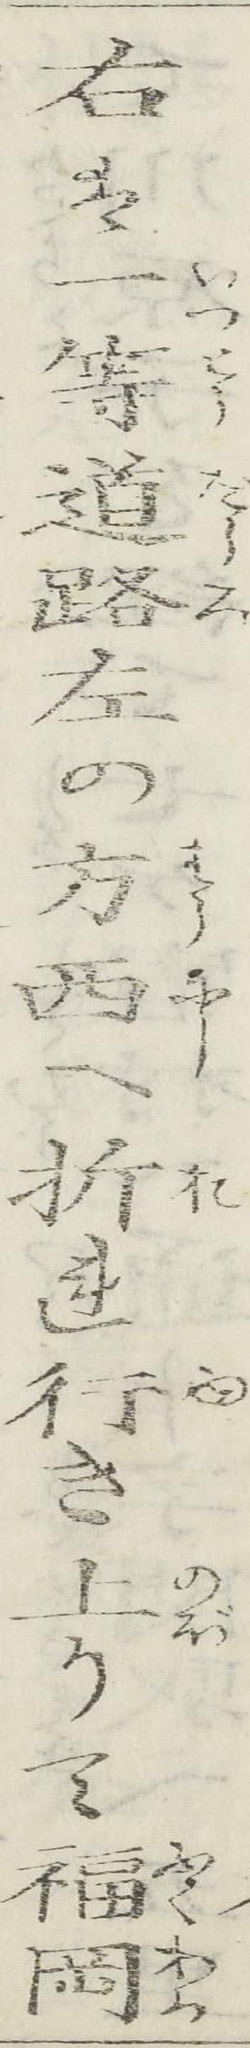右は一等道路左の方西へ折れ行き上りて福岡
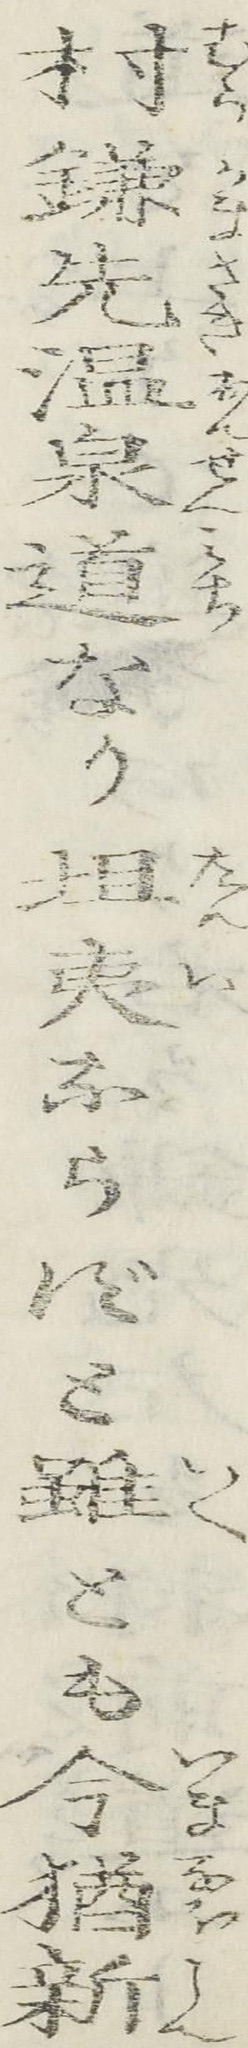村鎌先温泉町なり坦夷ならずと雖とも今猶新
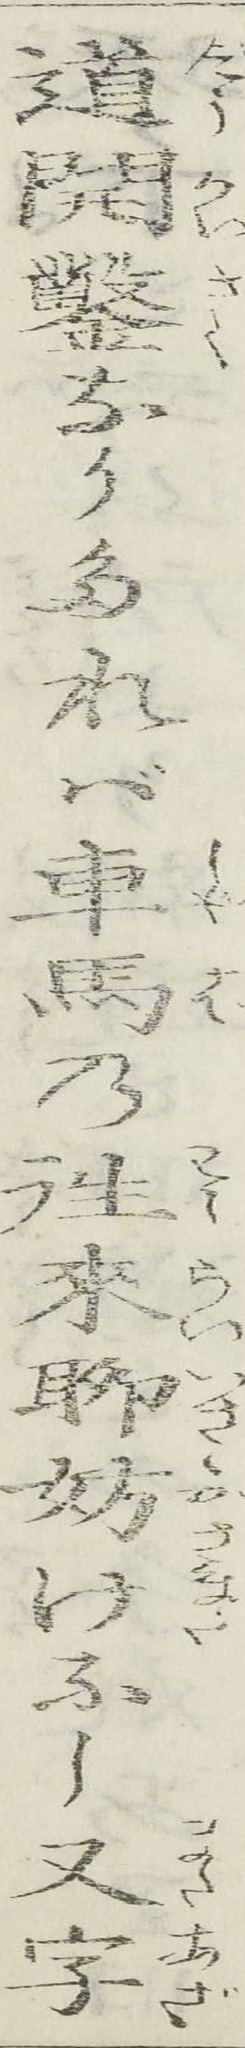道開鑿なりたれば車馬の往来聊妨けなし又字

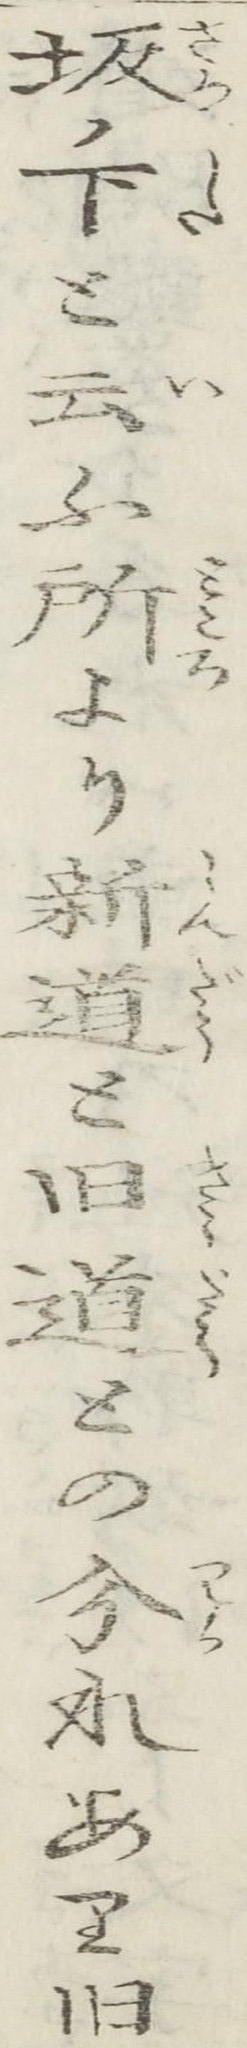坂ノ下と云ふ所より新道と旧道との分れある旧
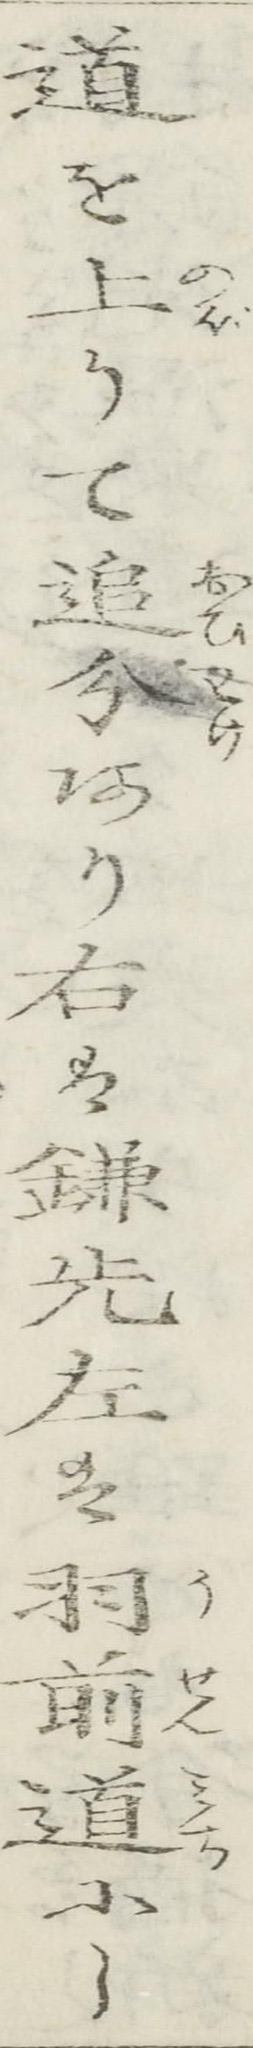道を上りて追分あり右は鎌先左は羽前道にし
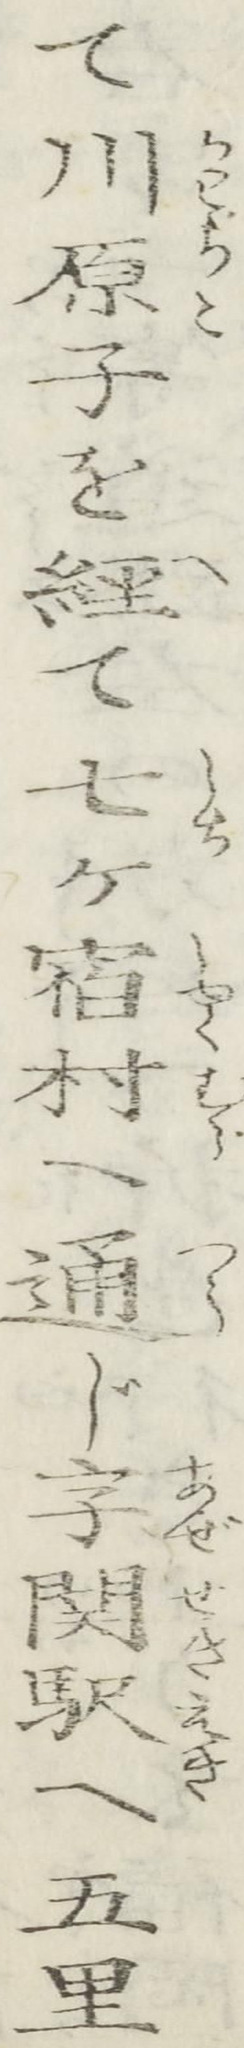て川原子を経て七ヶ宿村へ通じ字関駅へ五里
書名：鎌先温泉由來記
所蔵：東京大学地震研究所図書室 Earthquake Research Institute Library, The University of Tokyo, JAPAN
